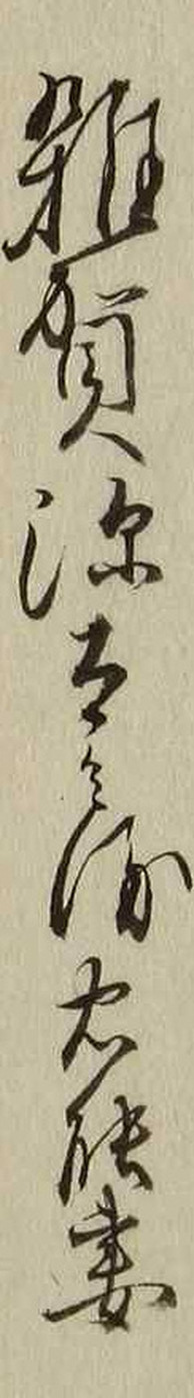女雑賀源太兵衛忠能妻
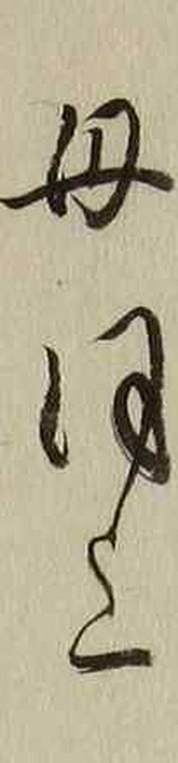母同上
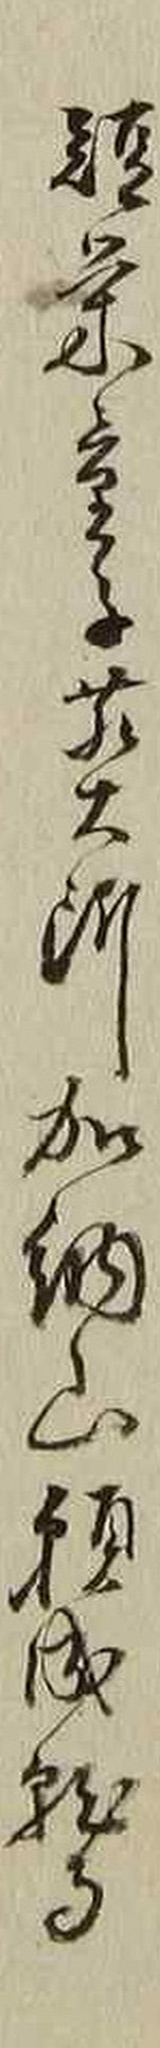短栄童子葬所加納山願成就寺
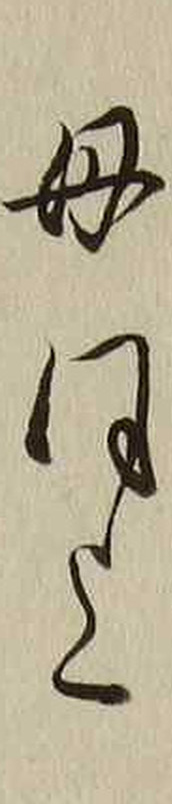母同上
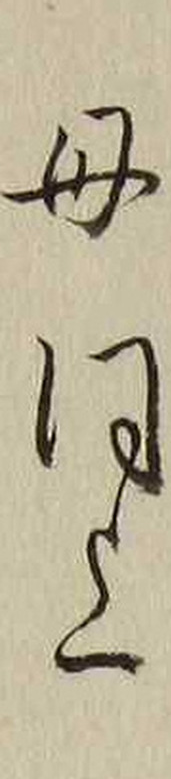母同上
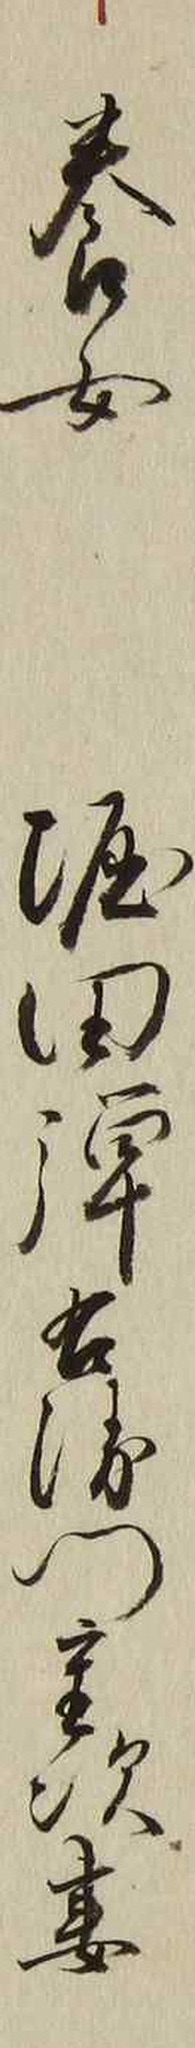養女堀田弾右衛門重次妻
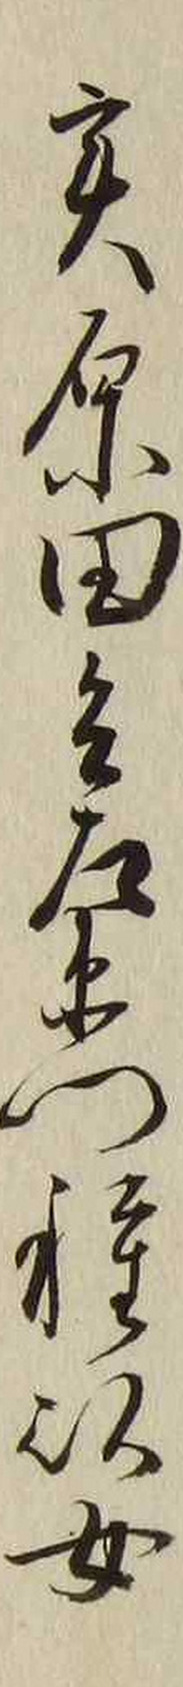実原田今右衛門種以女

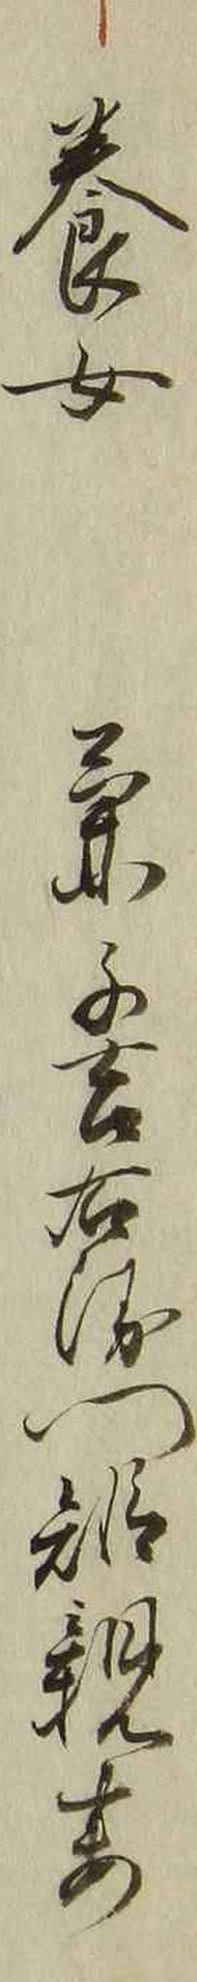養女兼子吉右衛門矩親妻
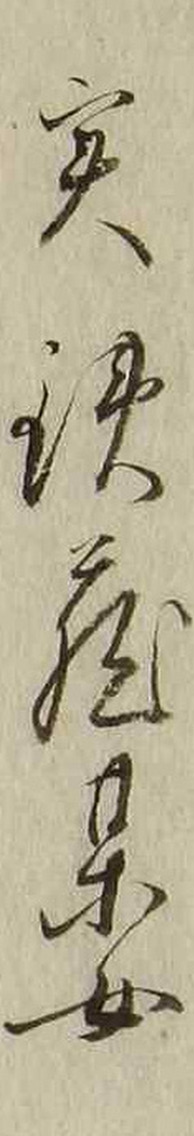実銕蔵某女
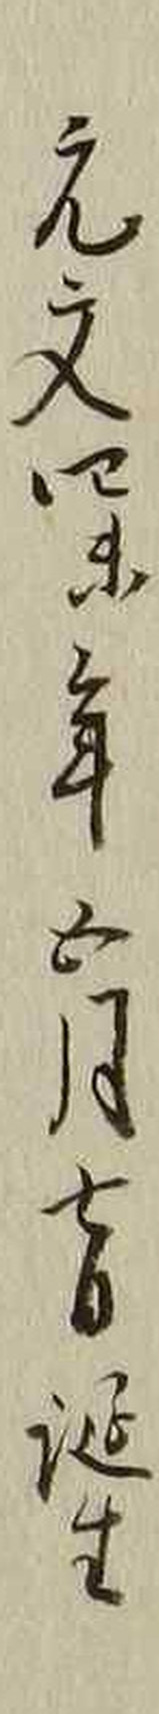元文四未年五月七日誕生
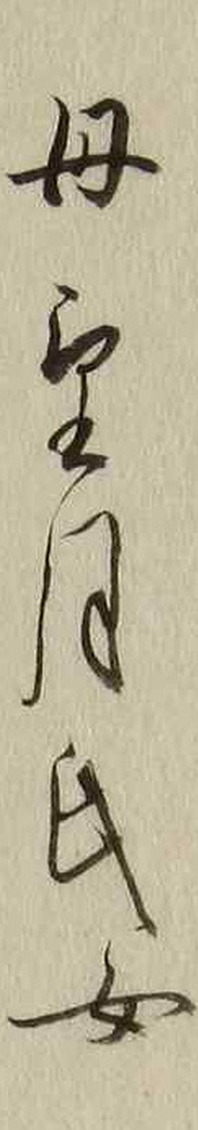母望月氏女
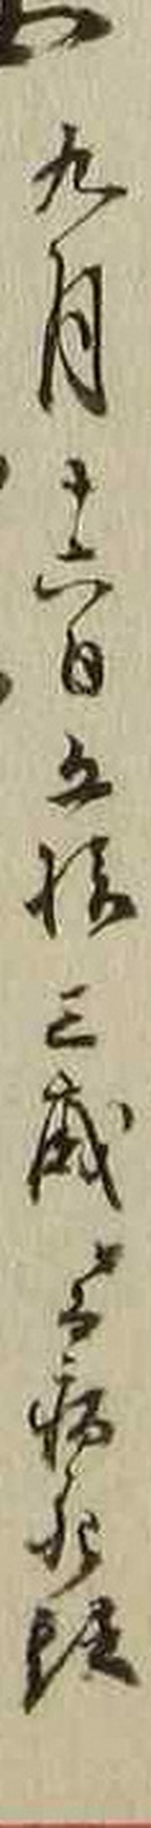九月十六日五拾三歳ニ而病死法
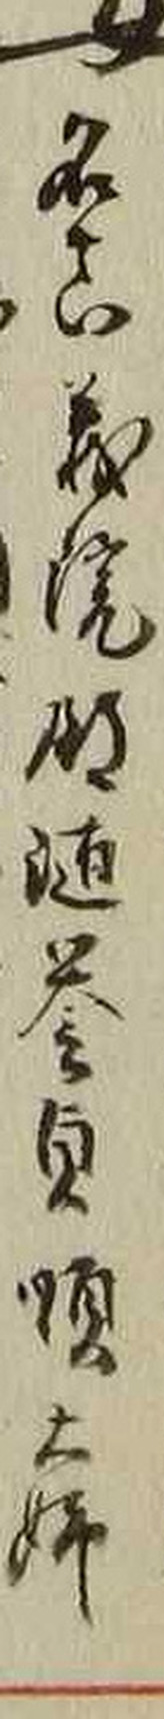名真義院明随誉貞順大姉
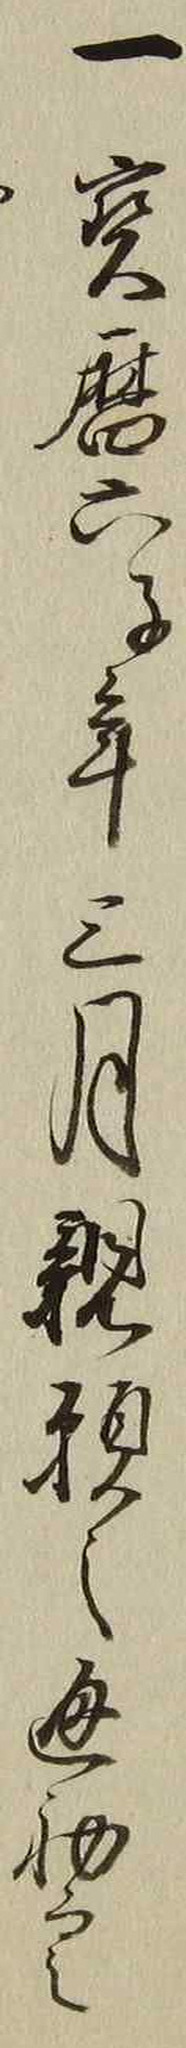一宝暦六子年三月親願之通初而之
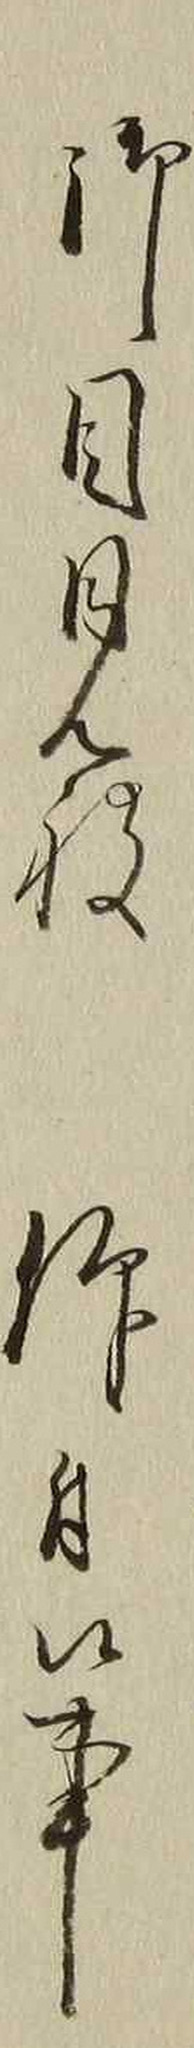御目見被仰付候事
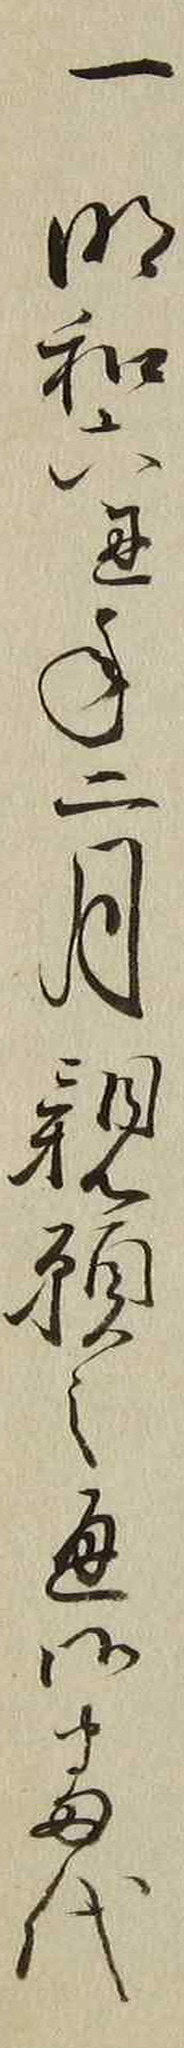一明和六丑年二月親願之通御番代
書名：諸士系譜　巻之2　い之部2
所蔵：会津若松市立会津図書館
